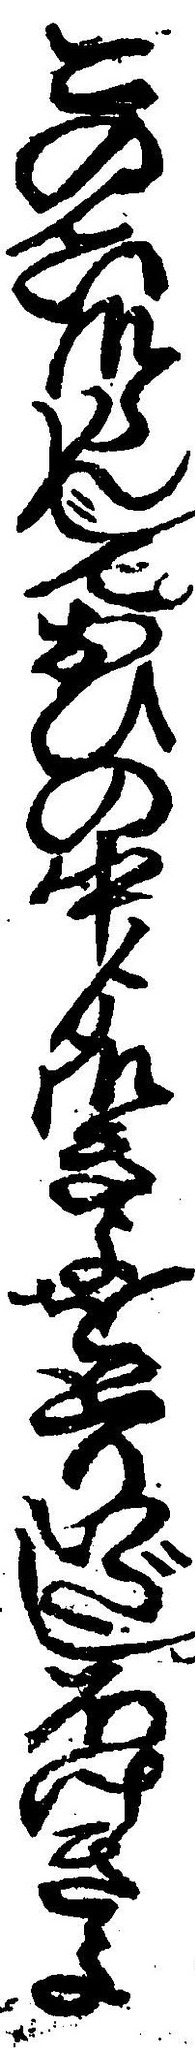このてい御らんじて。おひの中より御きよをとりいだし。ほけきよ
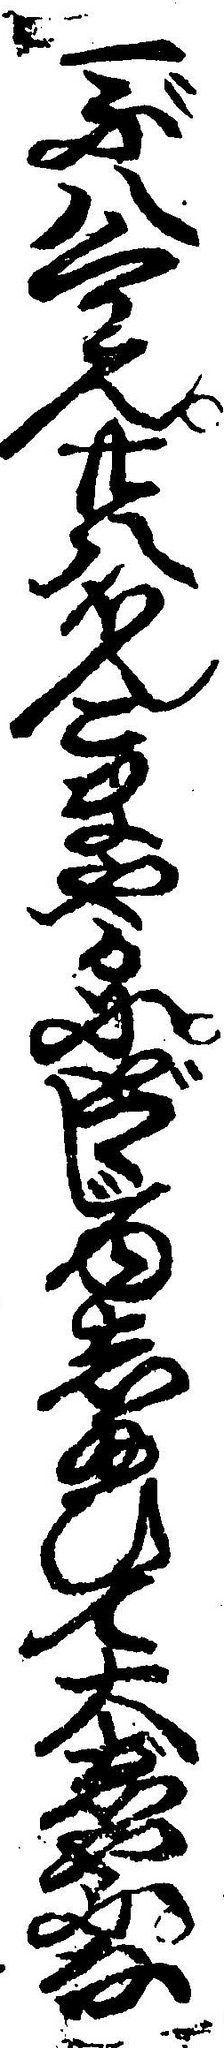一ぶ八くわん。廿八ほんこまやかに。どくじゆし給ひて大じやに。な
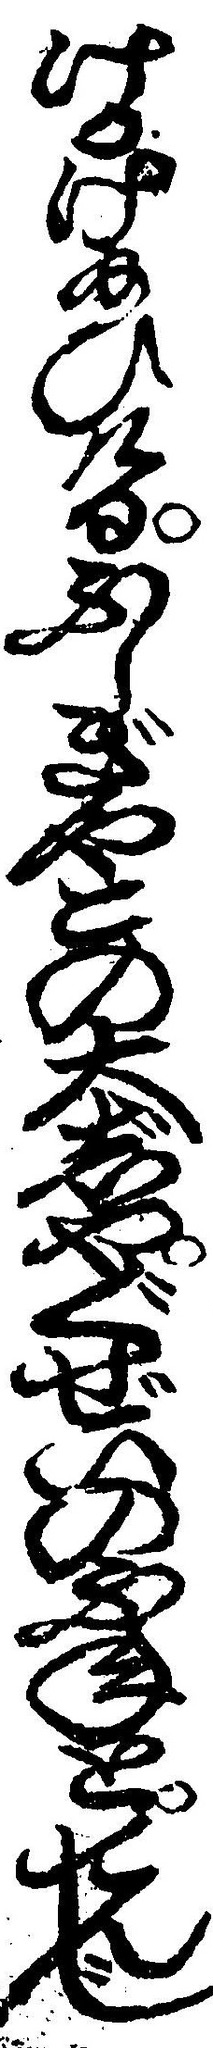けかけ給ひける。ふしぎやこの大じや。ぐぜいのふねと。てんじ
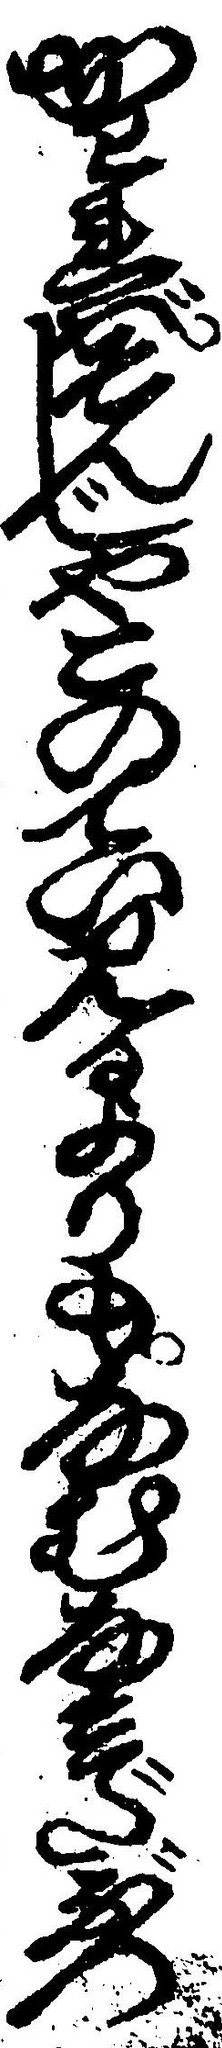かわれば。そんじやこのてい見るよりも。なむあみだぶつ

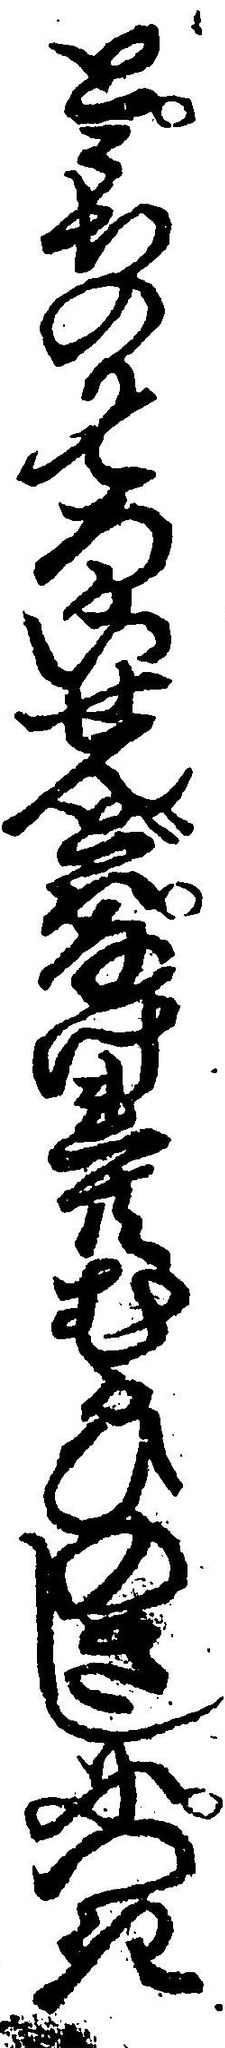と。うちのりてろかいせんどは。なけれ共むかひのきしに。つき
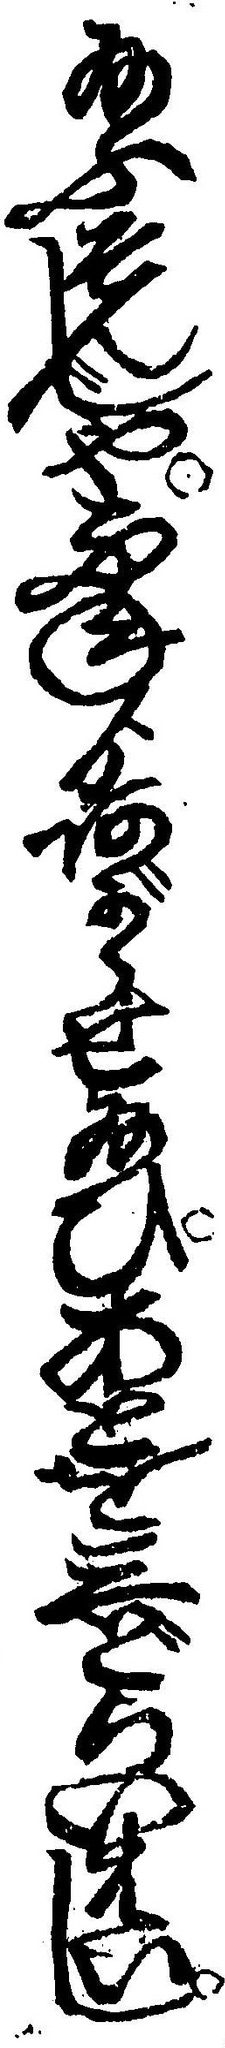給ふそんじや。ふねゟあがらせ給ひ。あとを三どらいはいし。
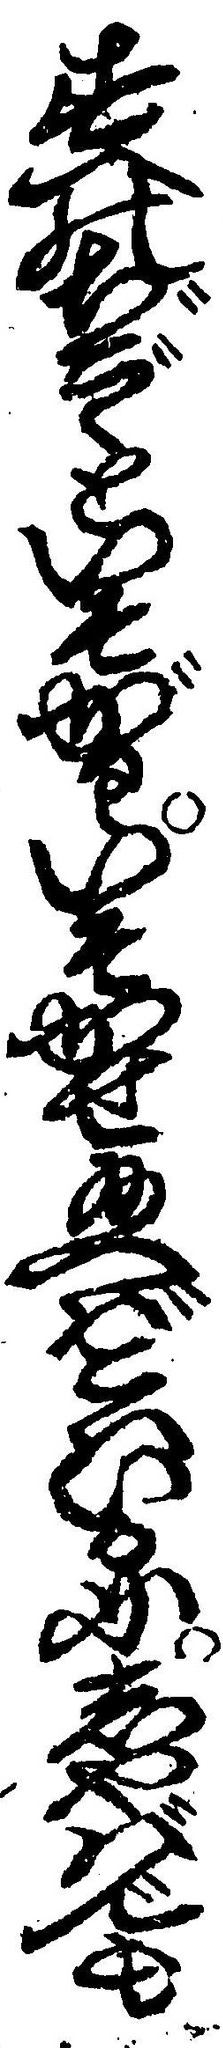すへのぢごくといそがるゝ。いそかせ給へばこはいかに。しやばでも
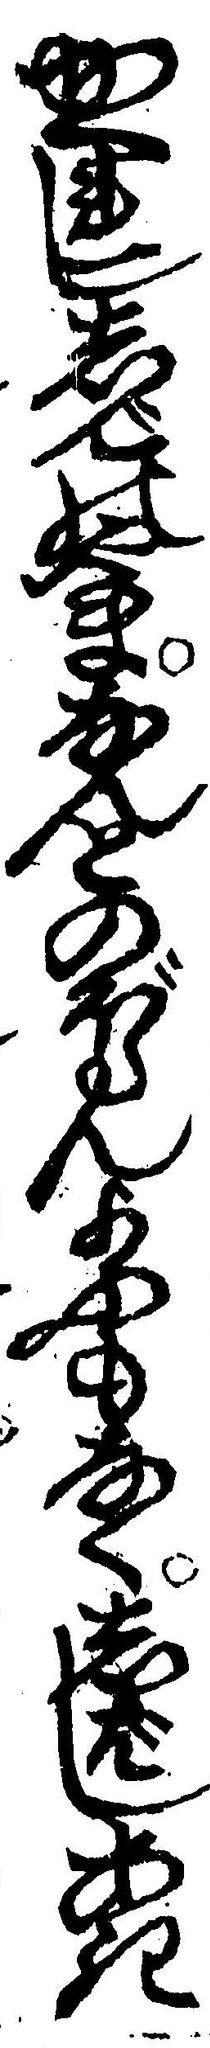かくれししでのやま。なんとのぼらんよふもなく。しばしあき
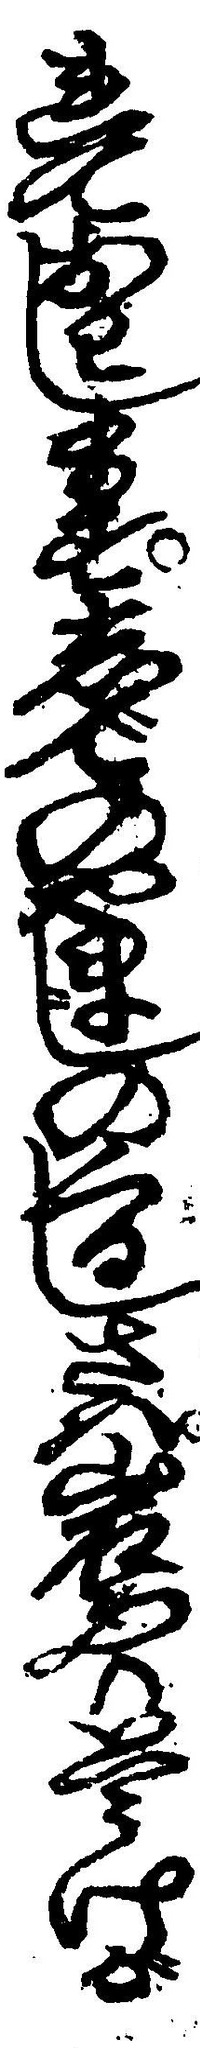れておわします。しでのやまじのくるしさは。岩やりとうけが
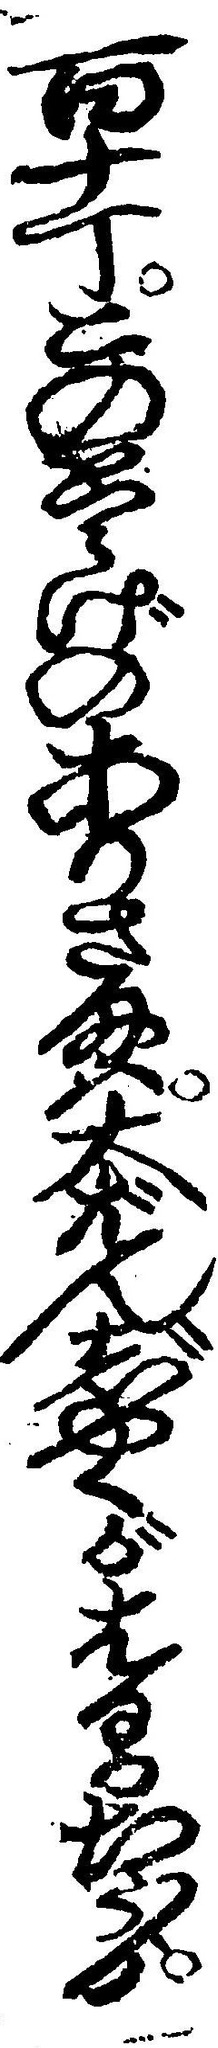百十丁。このとうげのありさまは。大ばんじやくがはるかちうゟ。
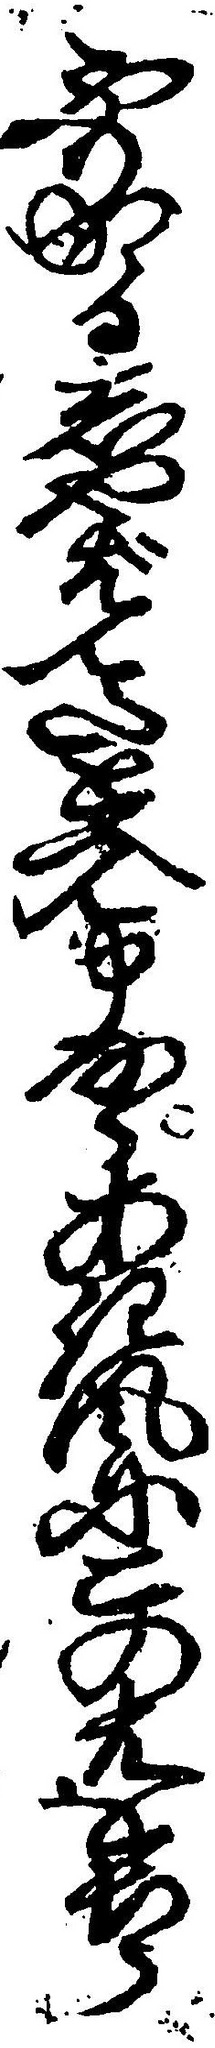ふりかゝるしやばてたとへて申なら。あき風にこのはをちら
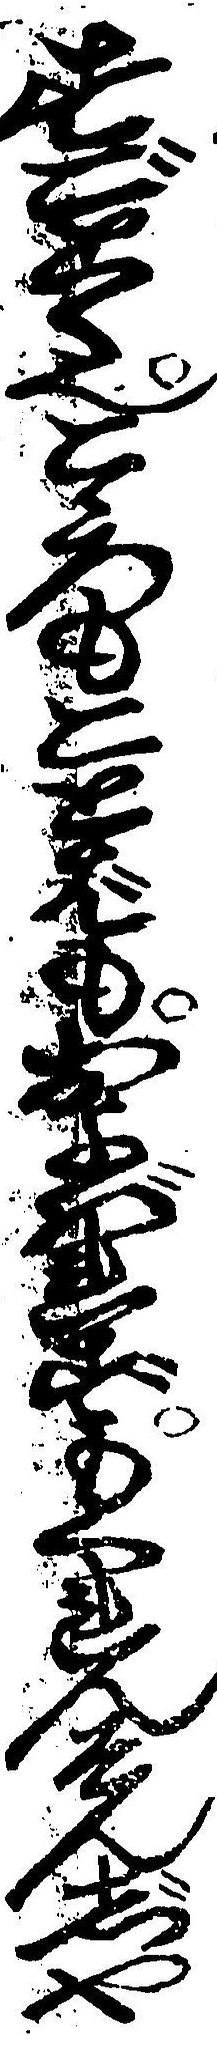すごとく也。こゝろもことばも。およばれず。もくれんそんじや
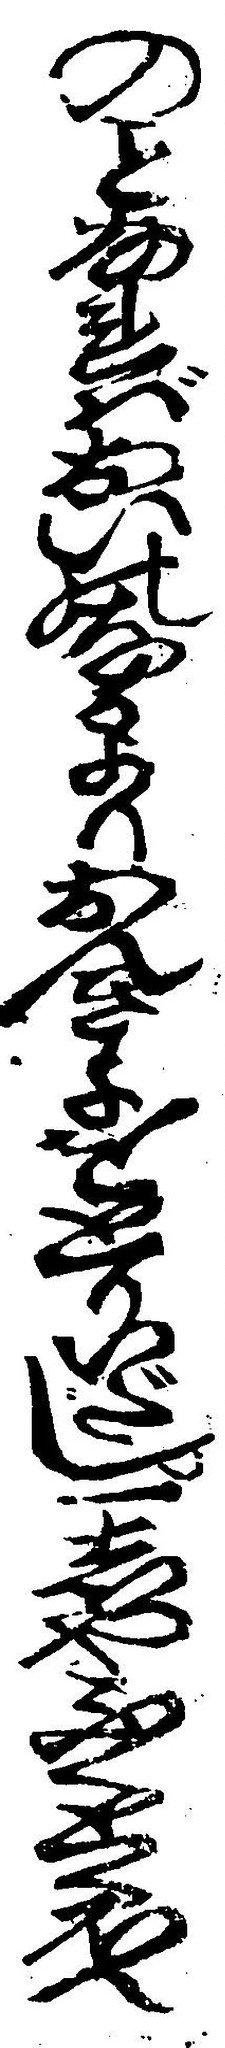のことなればおいのなかよりおんきよをとりいだし。一しやふくとくほん
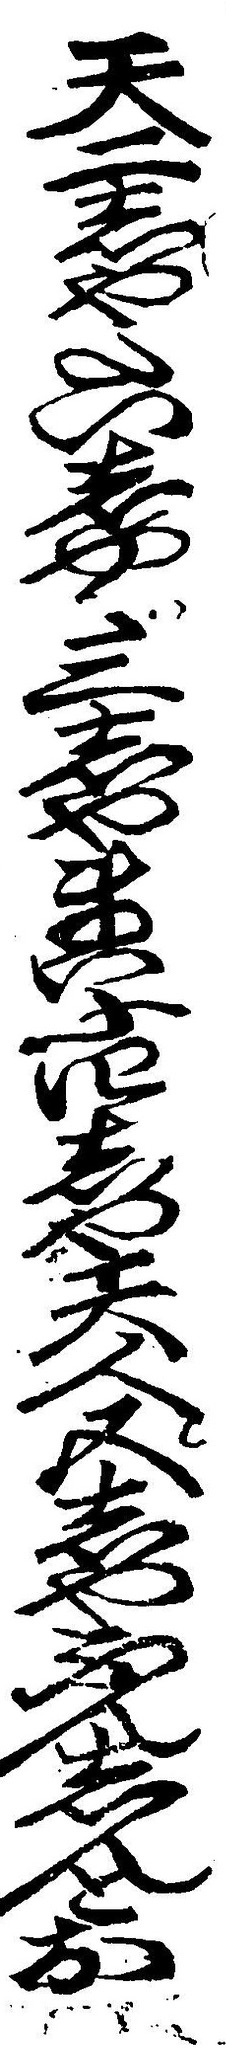天二しやたいしやく三しやまいふ四しや天人。五しやふんしんとお
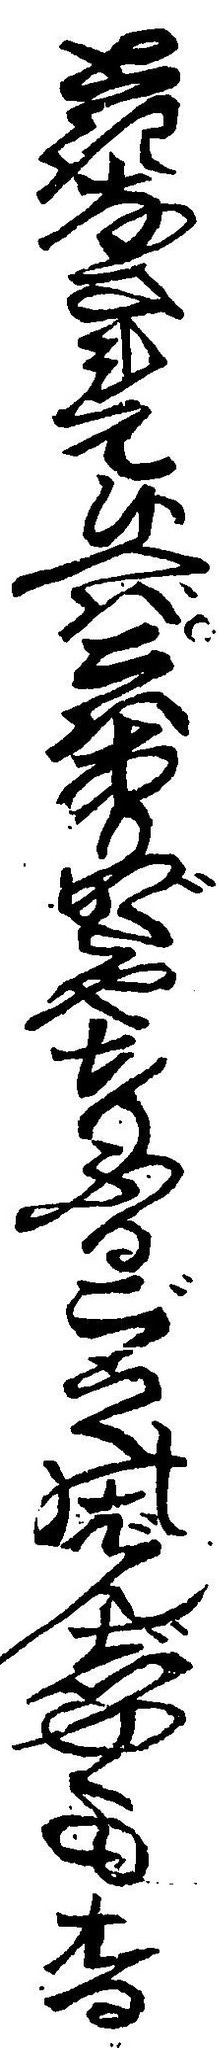ときなされて候へば。こはありがたやちりふるごとくのばんじやくもはる
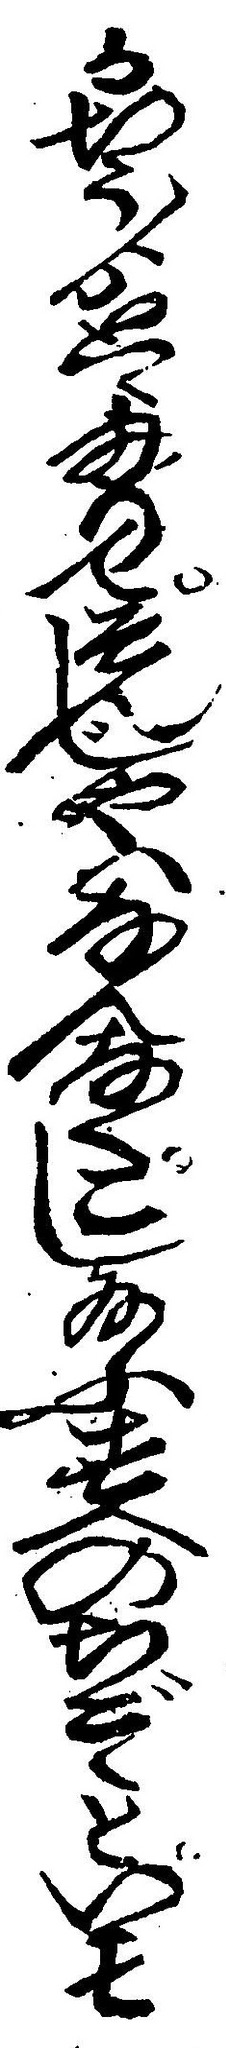かちうゟとゝまりて。そんじやはなんなく。こし給ふすへのちごくと。いそ
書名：目連尊者地獄めくり / 宇留藤太夫正本
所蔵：東京大学総合図書館 General Library in the University of Tokyo, JAPAN
